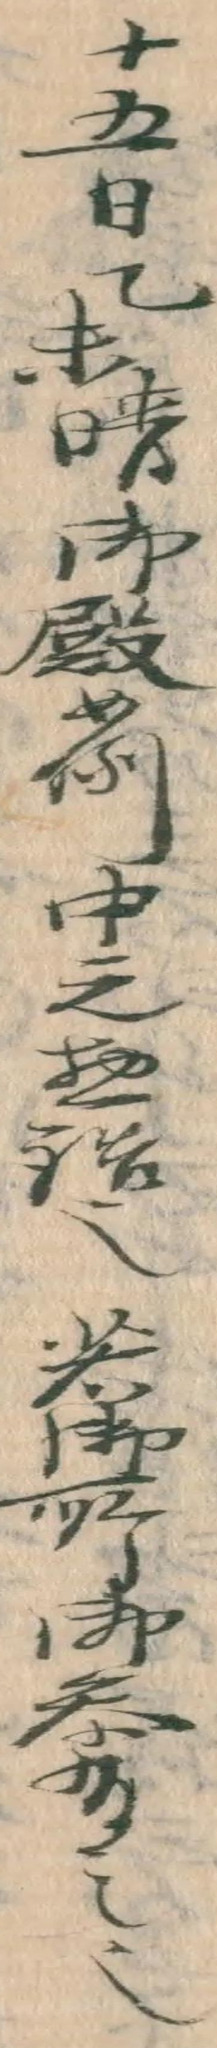十五日乙未晴御殿如例中元惣詣也若御所御参有之也
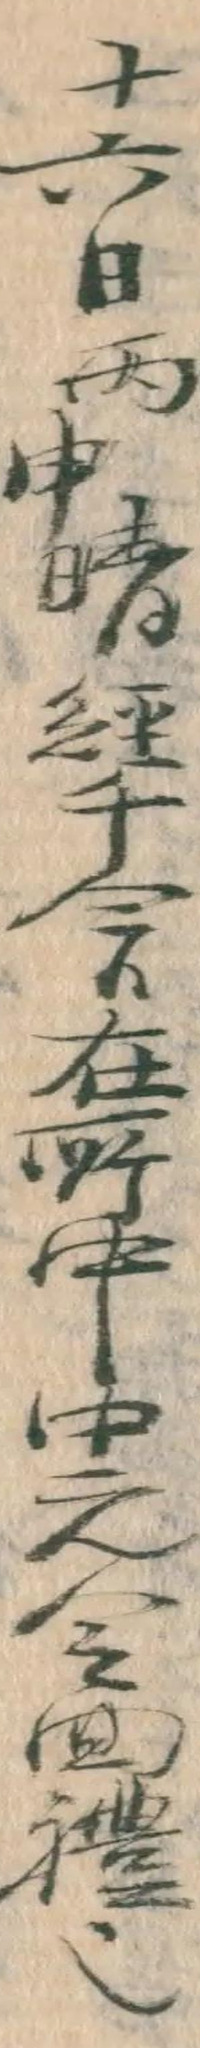十六日丙申晴経千令在所中中元令回禮也
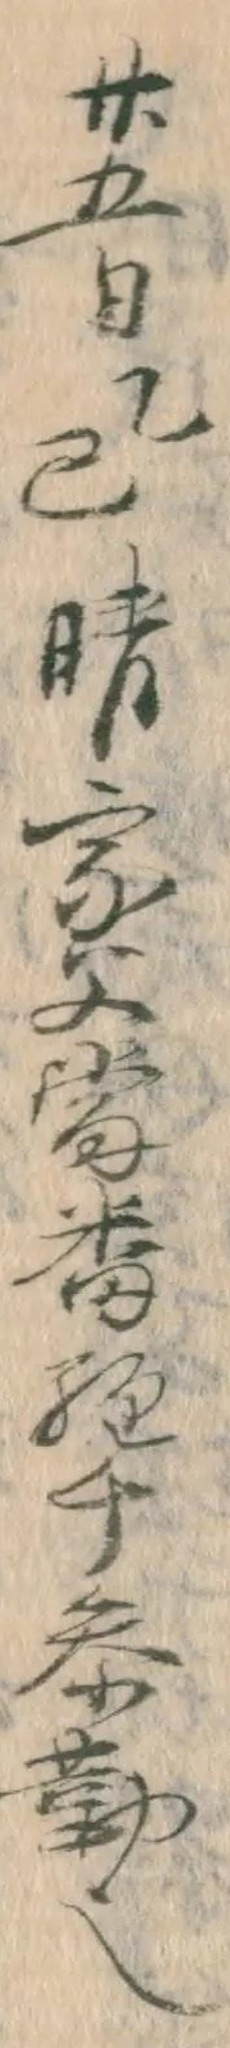廿五日乙巳晴家父當番経千参勤也
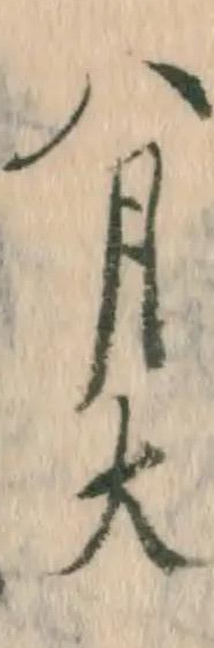八月大
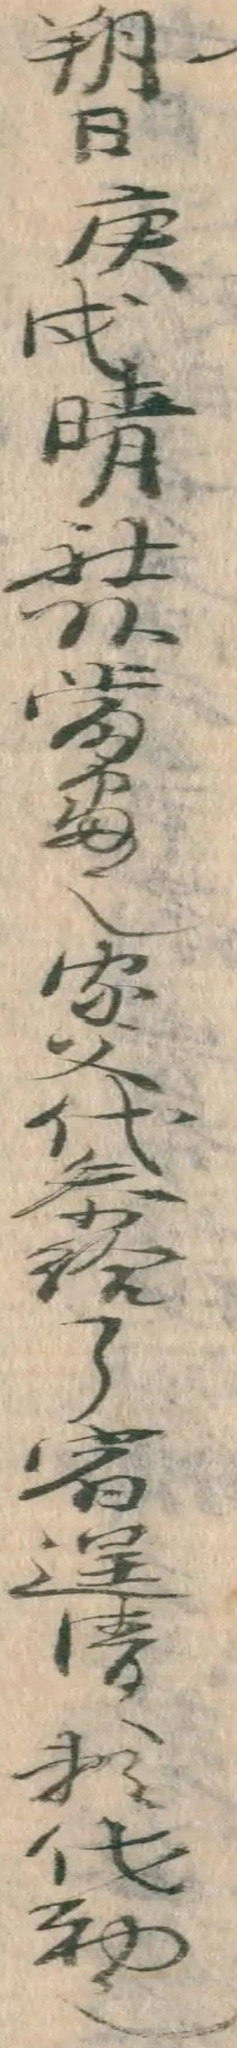朔日庚戌晴社頭當番也家父代参給了宿逞清へ頼代勤也
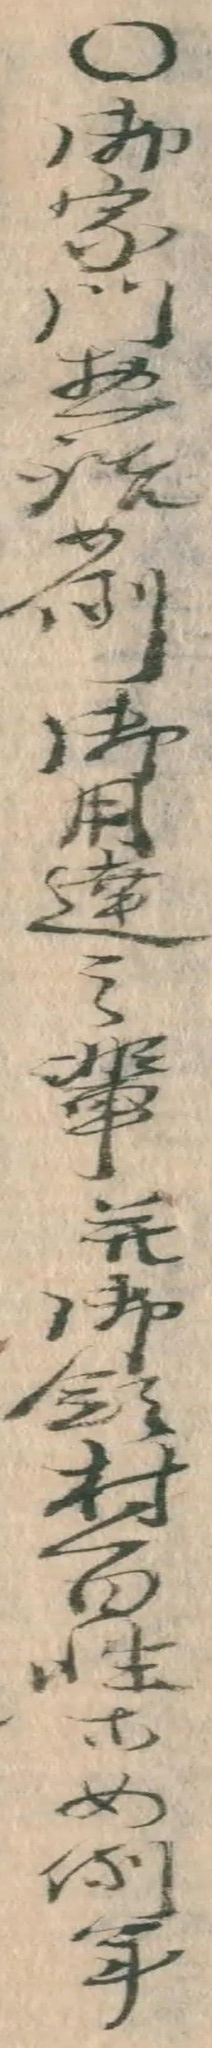○御家門惣詣如例御用達之輩并御領村百性等如例年
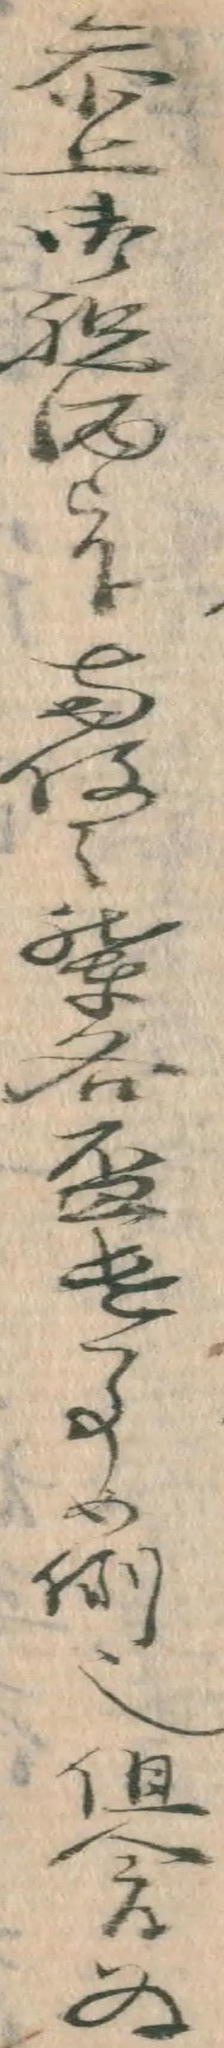参上御祝酒被下両役之輩各盃遣候事御例也但今日為
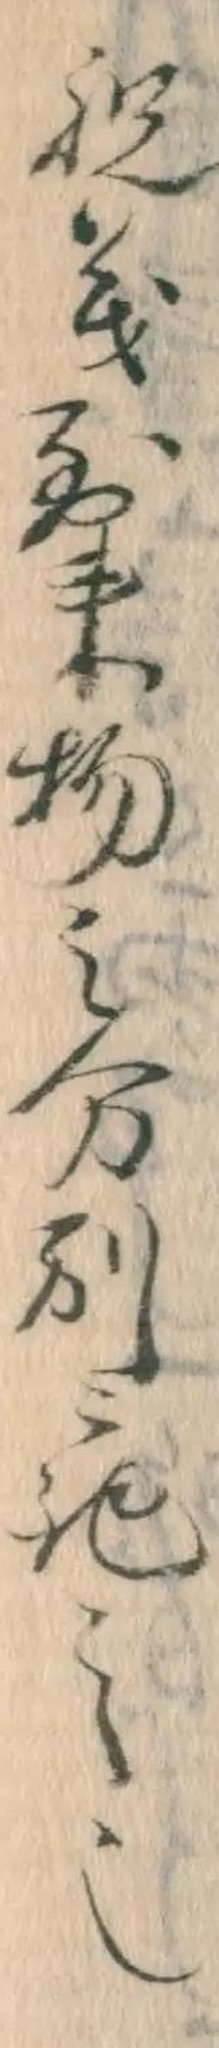祝義到来物之分別ニ記之也
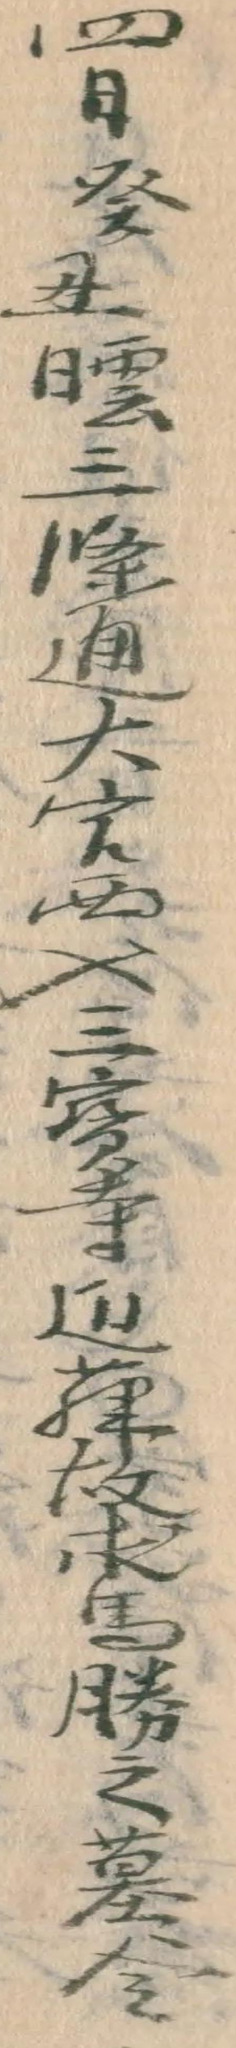四日癸丑曇三條通大宮西入三寶寺近藤故求馬勝之墓金
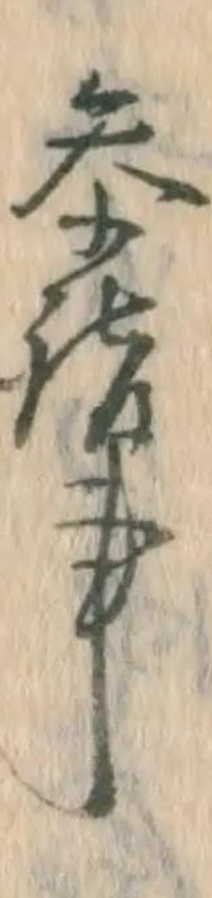参詣事
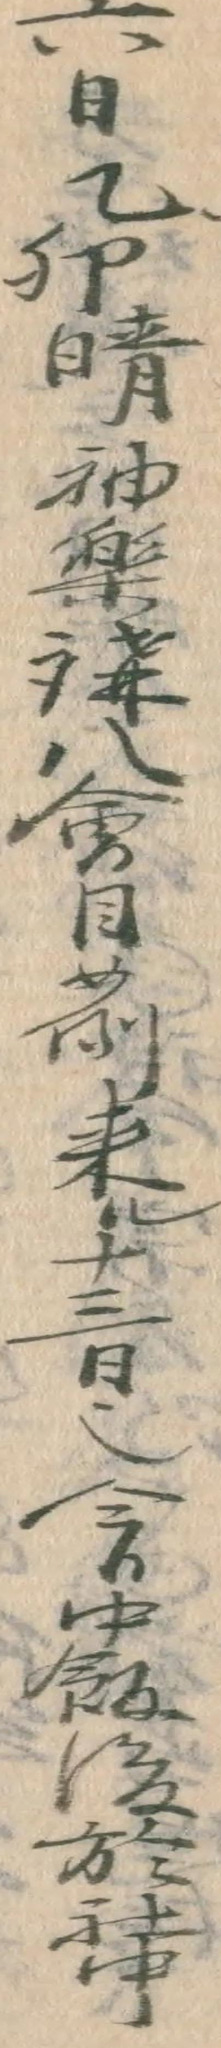六日乙卯晴神楽講八會目前如例来ル十三日也今日中飯後於社中
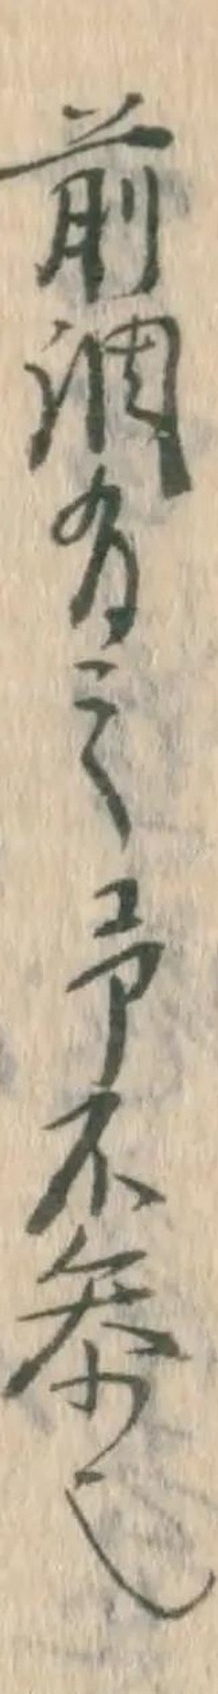前調有之予不参也
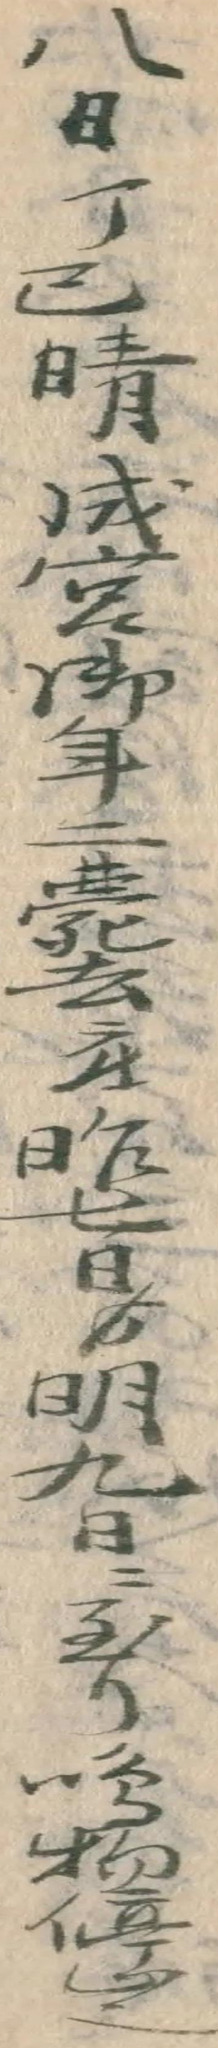八日丁巳晴成宮御年二薨去ニ付昨七日ゟ明九日ニ至リ鳴物停止也
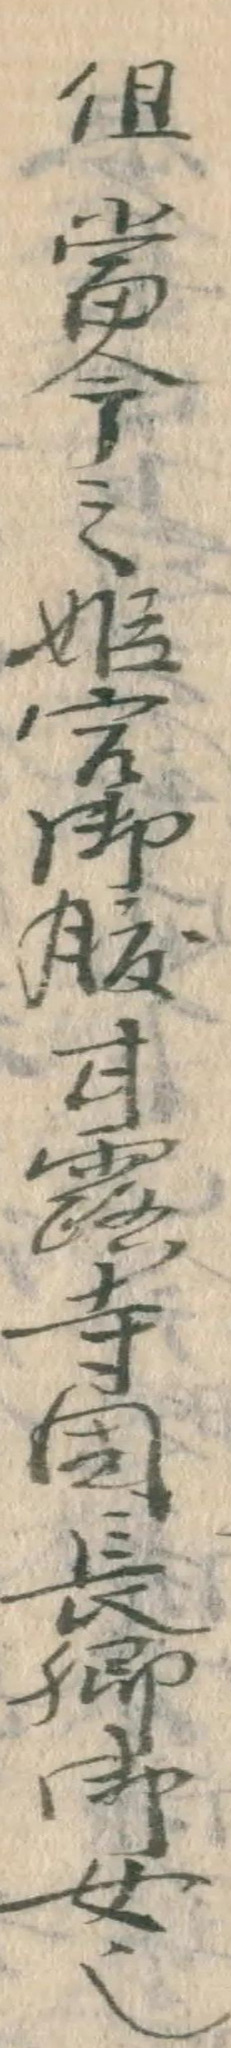但當今之姫宮御腹甘露寺国長卿御女也
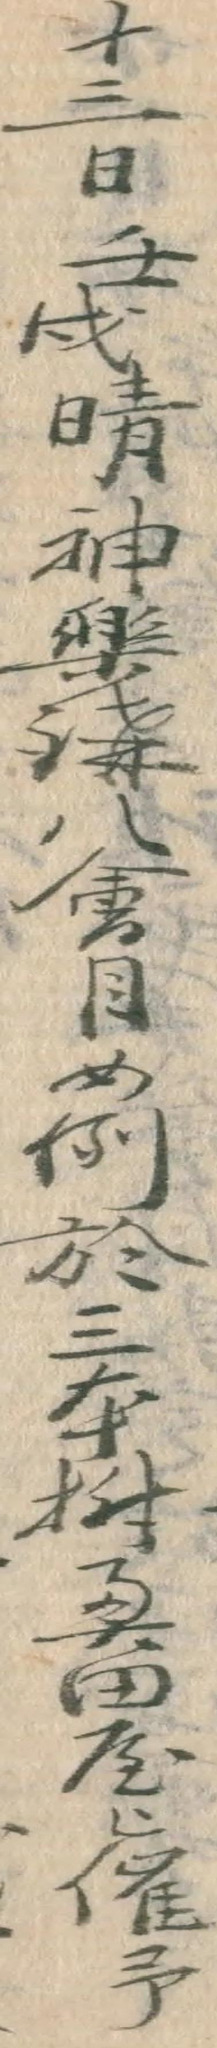十三日壬戌晴神楽講八會目如例於三本樹奥田屋被催予
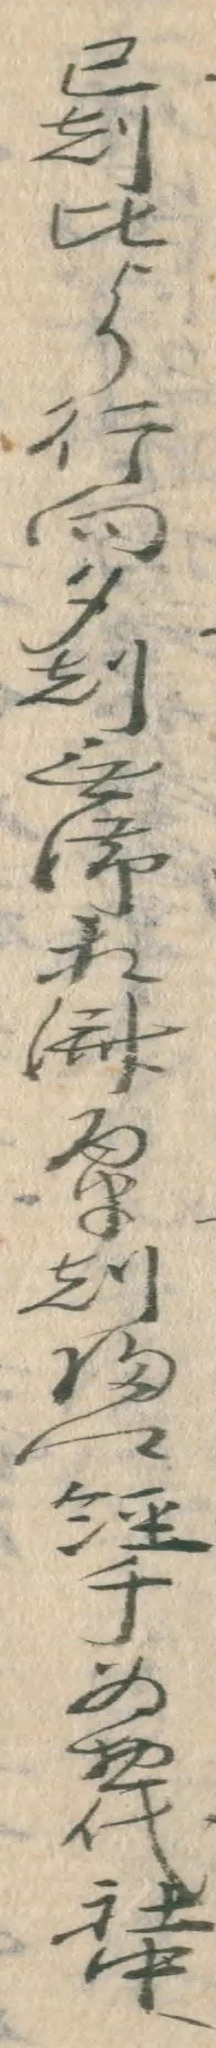巳刻比より行向夕刻無滞相済酉半刻帰郷経千為惣代社中へ
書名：賀茂社記録. 第65冊
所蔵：国立国会図書館 National Diet Library, JAPAN
